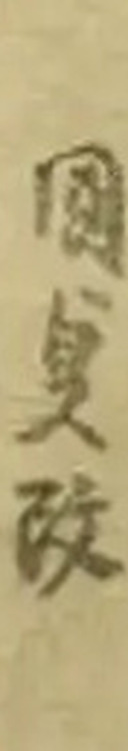国貞改
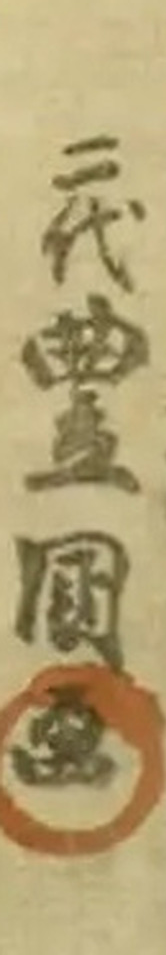二代豊国画
